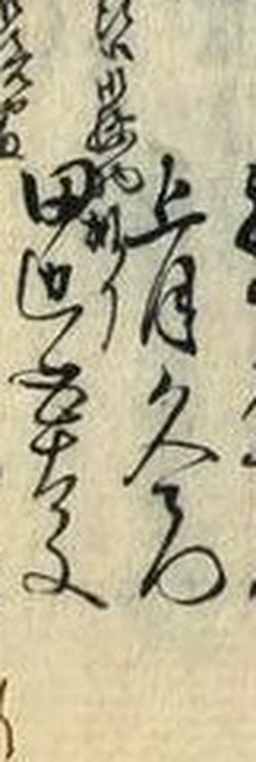田辺五太夫
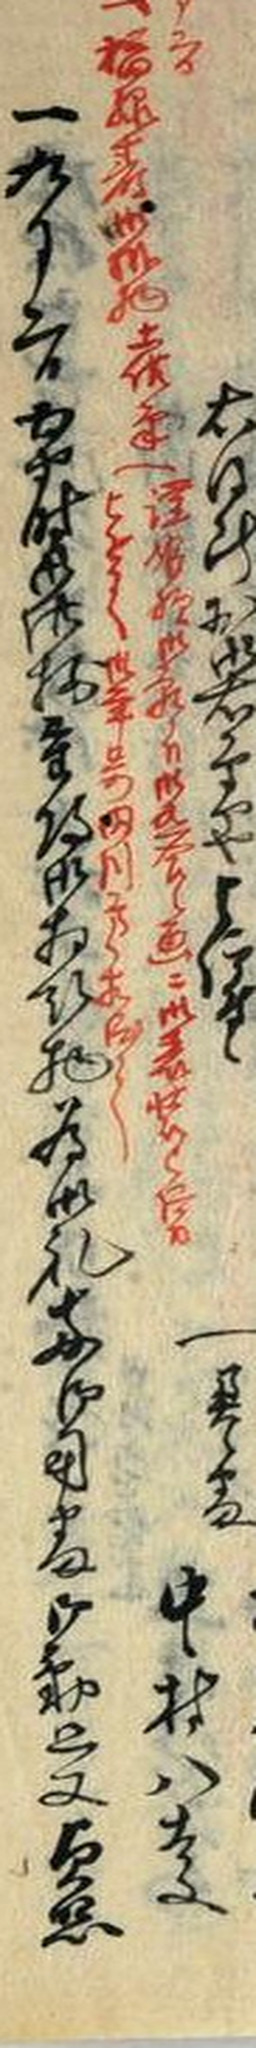一九月二日五半時御供揃重陽御拝領物為御礼両御用番御勤且又貞照

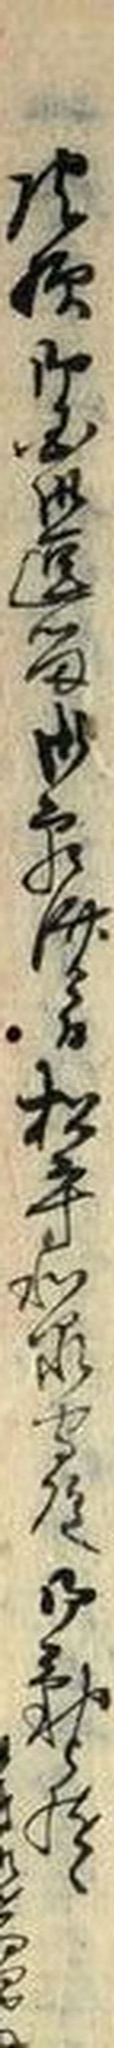院様御国御逗留御願済候ニ付松平和泉守殿へ御勤被遊候
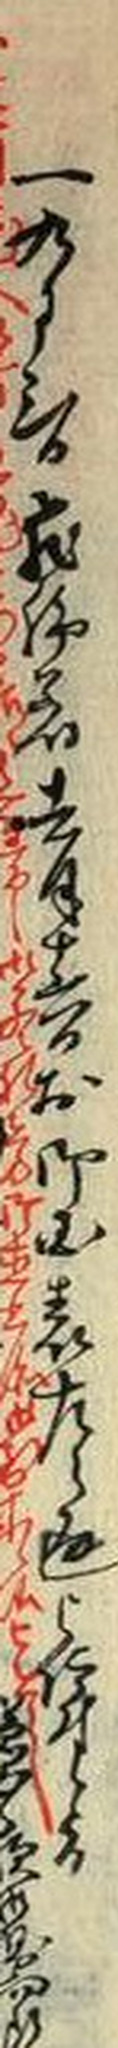一九月三日飛脚着去月十六日於御国表左之通被仰付候旨
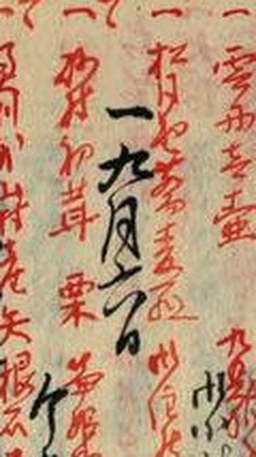一九月六日
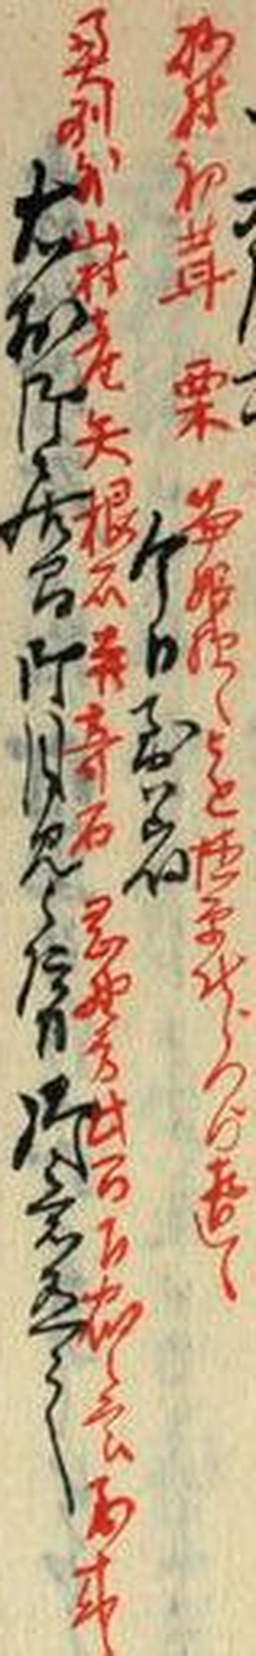右於御居間御目見被仰付御意有之
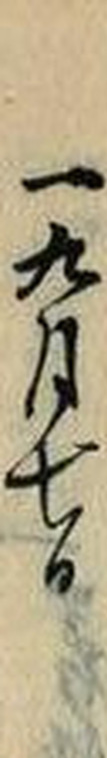一九月七日
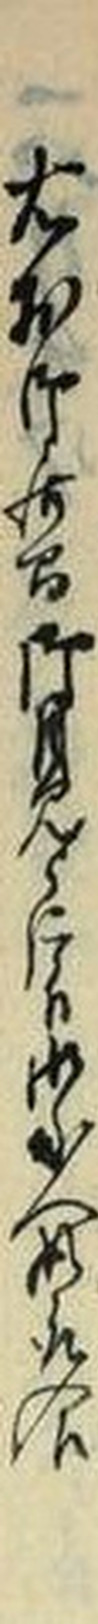右於御居間御目見被仰付御用人御取合
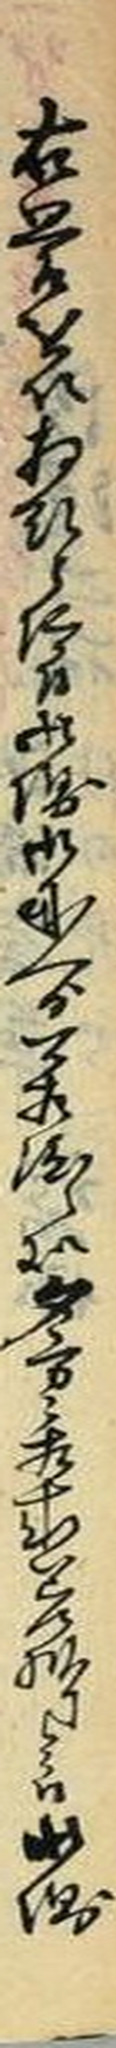右思召を以拝領被仰付御側御用人ゟ可相渡候処夕方ニ相成差掛り候ニ付御側
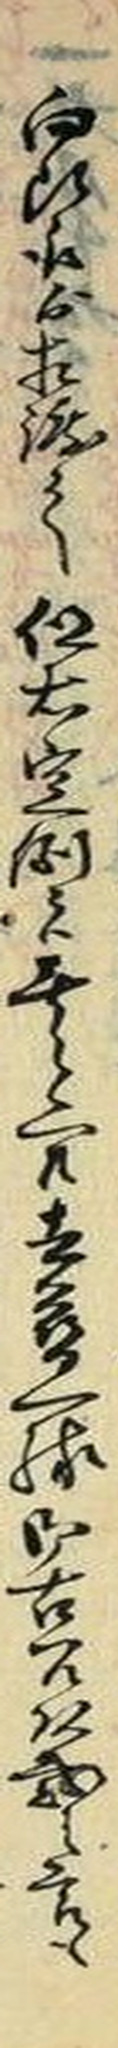向頭取ゟ相渡之但右定例ニハ無之候へ共去暮一統御古召頂戴之節も
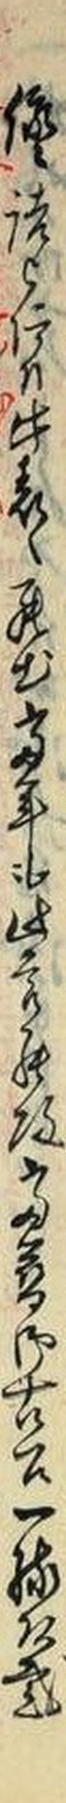俄ニ詰被仰付此表へ罷出当年も此節罷帰当暮御古召一統頂戴
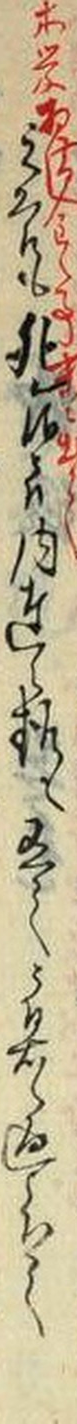之節も外レ候ニ付内達之趣ニ有之ニ付右之通被下之
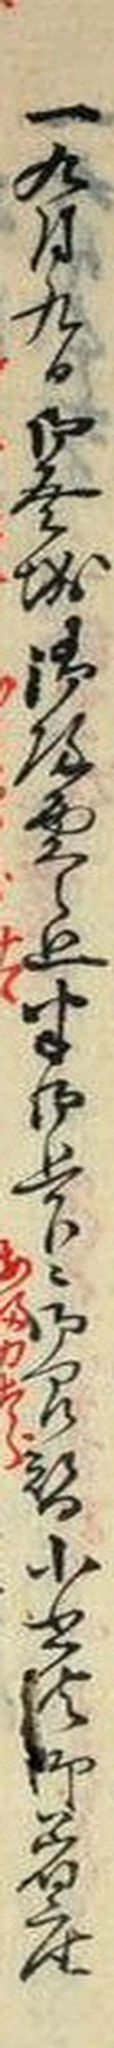一九月九日御登城御帰殿之上半御上下ニ御召替小書院御着座
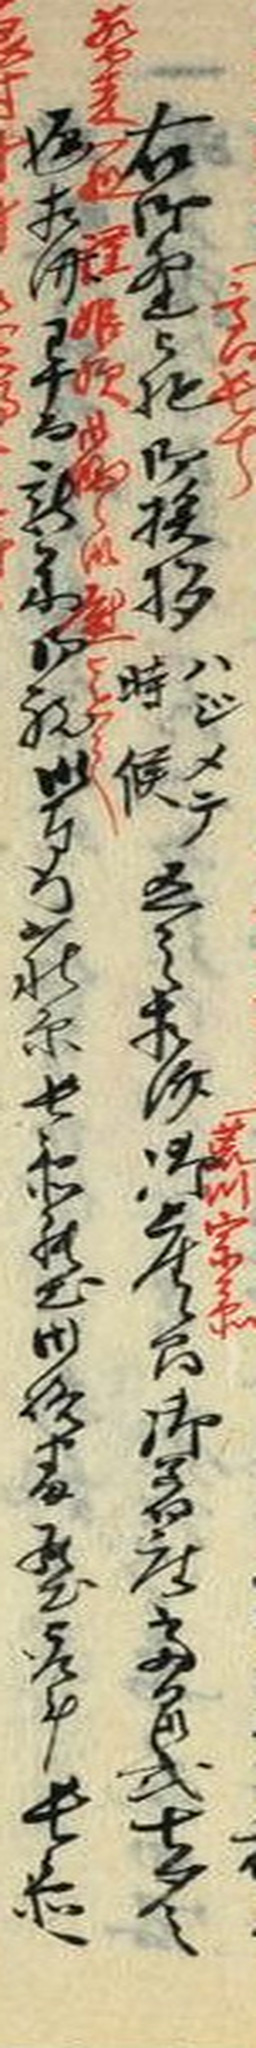通相済畢而新米御祝御奉行萩原長兵衛罷出御膳番罷出被取計長兵衛へ
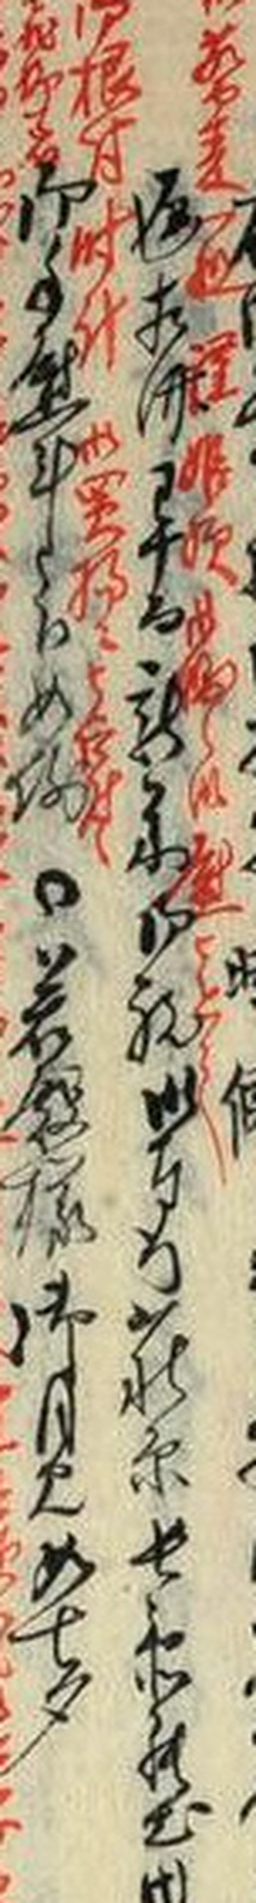御手熨斗被下如例○若殿様御月見如七夕
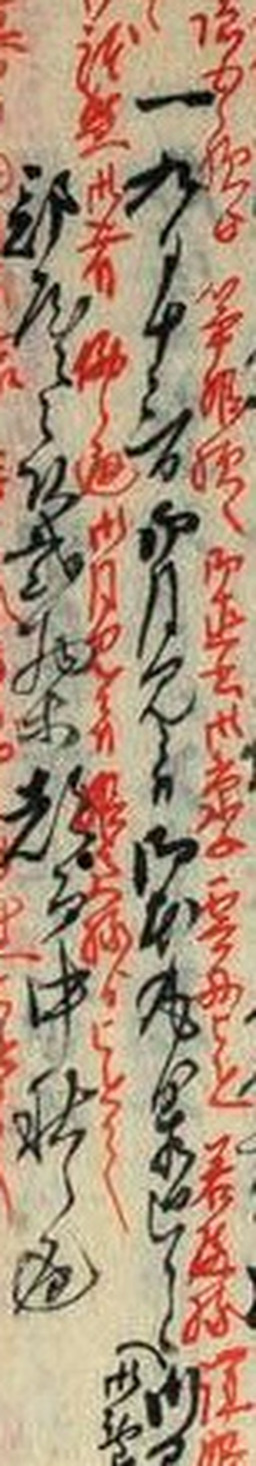部屋〃〃頂戴物等都而中秋之通
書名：少傅日録抄（斉承付側向頭取日記、在府）
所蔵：福井県文書館 Fukui Prefectural Archives
